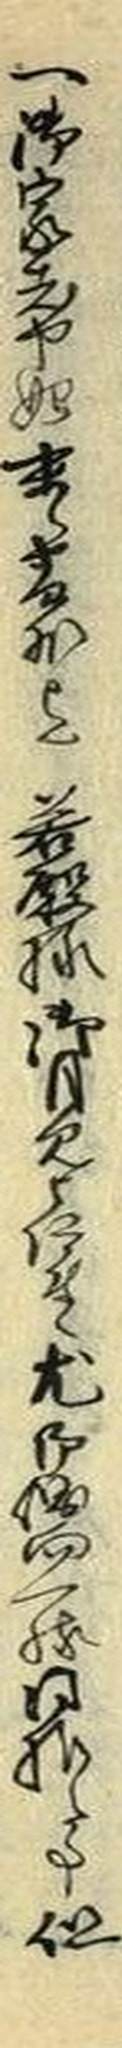一御家老中始未之番外迄若殿様御目見被仰付候尤御側向一統同様之事但
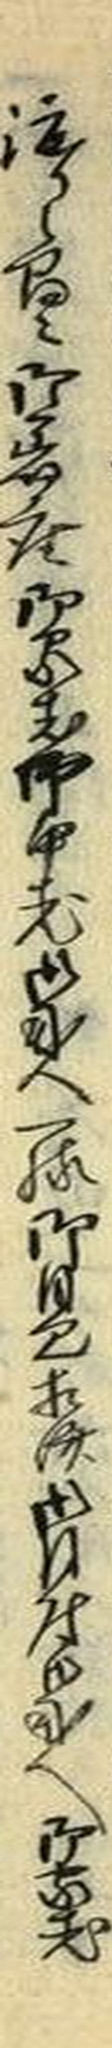渡之間ニ御着座御家老御中老御用人一統御目見相済御目付御用人御家老
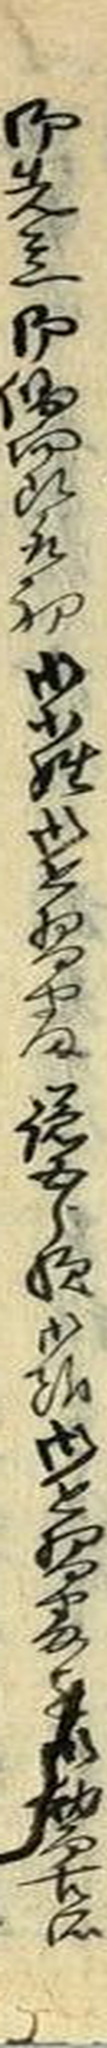御先立御側向頭取初御小姓御近習番謙五郎様御附御近習番迄御稽古所
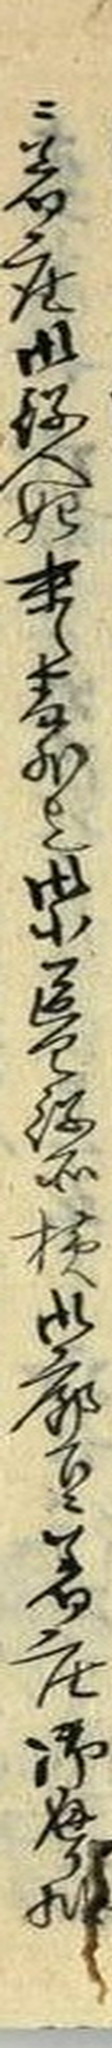ニ着座御役人始未之番外迄御小道具役所横へ御廊下ニ着座御通り掛
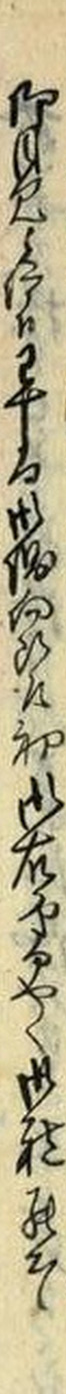御目見被仰付畢而御側向頭取初御右筆部やへ御礼罷出候
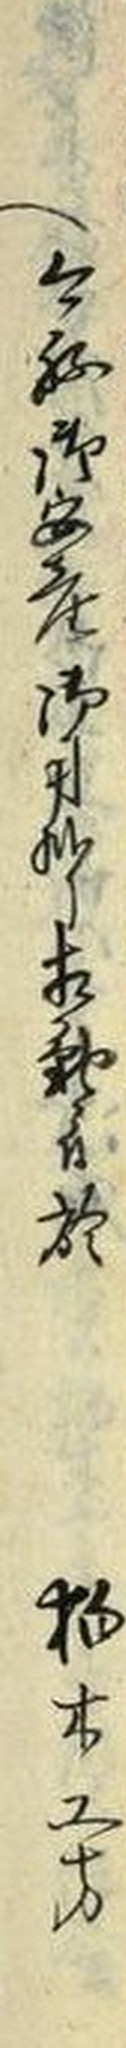今般御安産御用掛り相勤候ニ付狛木工方
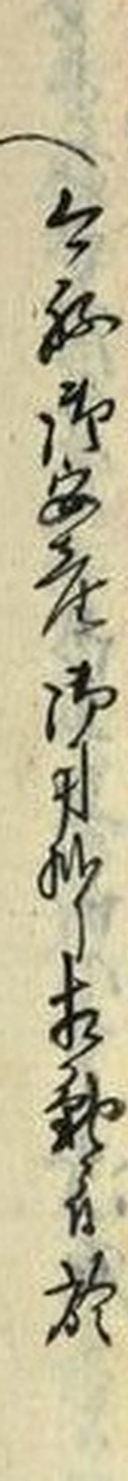今般御安産御用掛り相勤候ニ付狛木工方
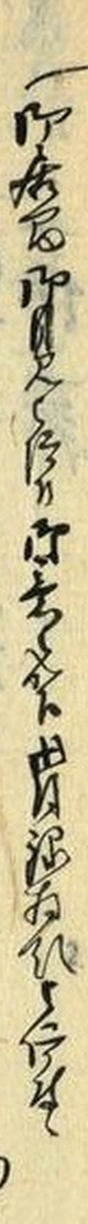御居間御目見被仰付御意被成下御目録拝領被仰付候
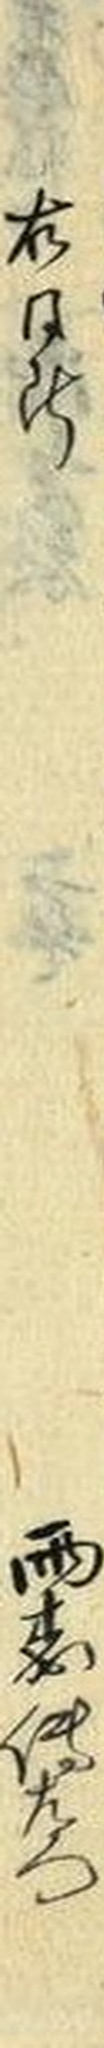右同断雨森伝左衛門
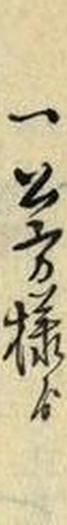一公方様ゟ
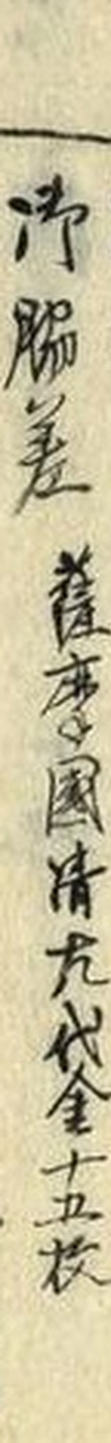御脇差薩摩国清左代金十五枚
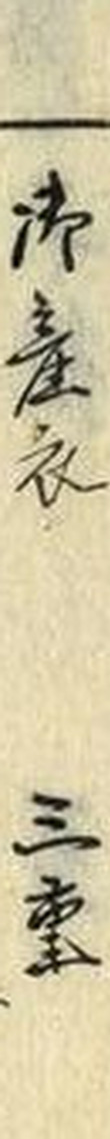御産衣三重
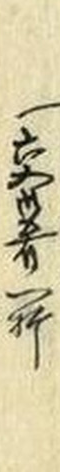交御肴一折
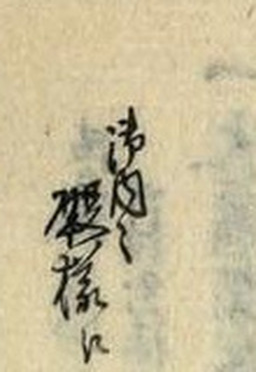御内々
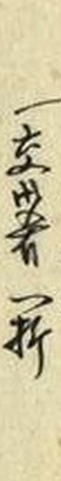交御肴一折

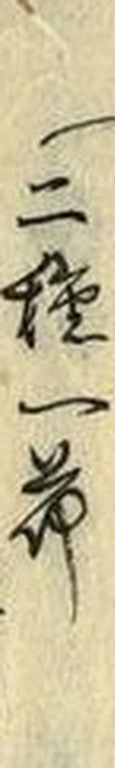二種一荷
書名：少傅日録抄（斉承付側向頭取日記、在府）
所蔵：福井県文書館 Fukui Prefectural Archives
